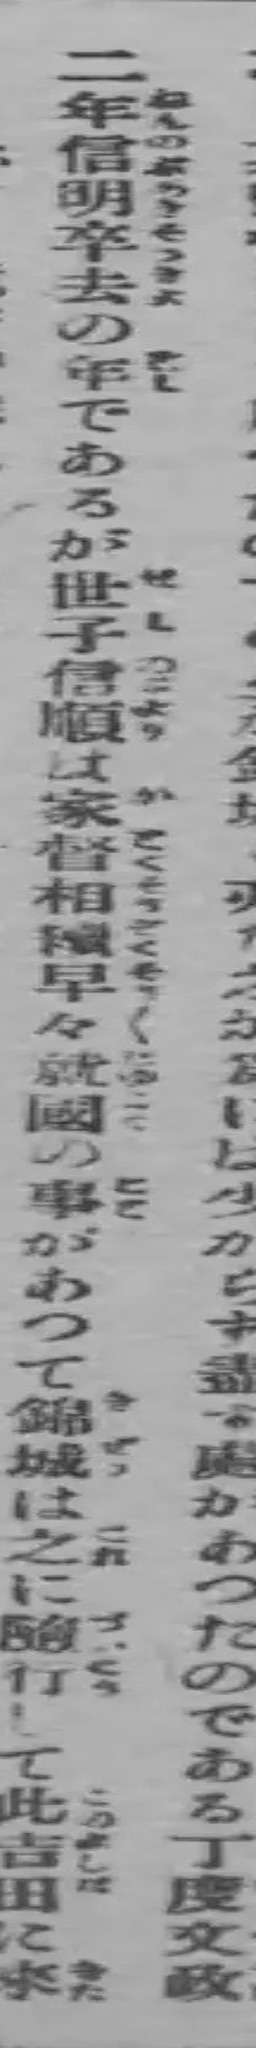二年信明卒去の年であるが世子信順は家督相続早々就国の事があつて錦城は之に随行して此吉田に来
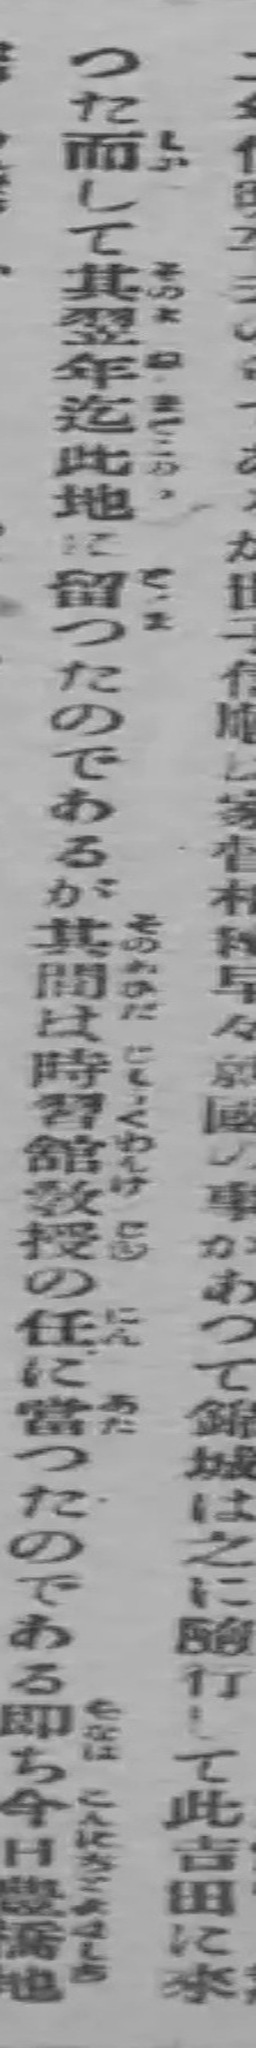つた而して其翌年迄此地に留つたのであるが其間は時習館教授の任に当つたのである即ち今日豊橋地
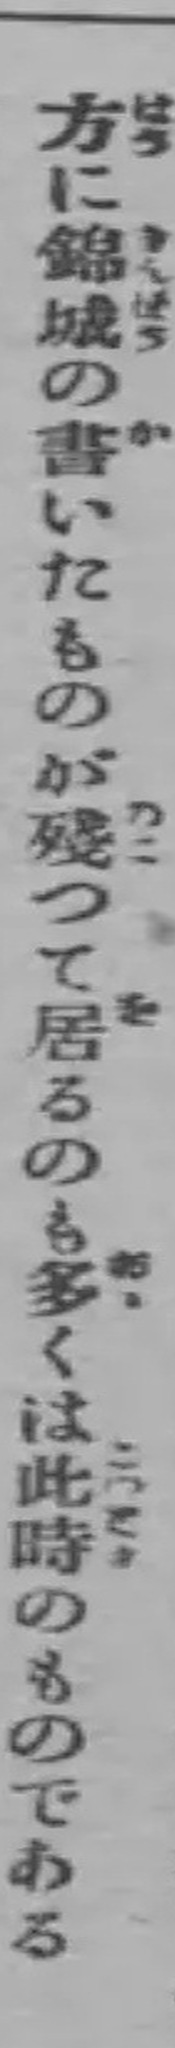方に錦城の書いたものが残つて居るのも多くは此時のものである
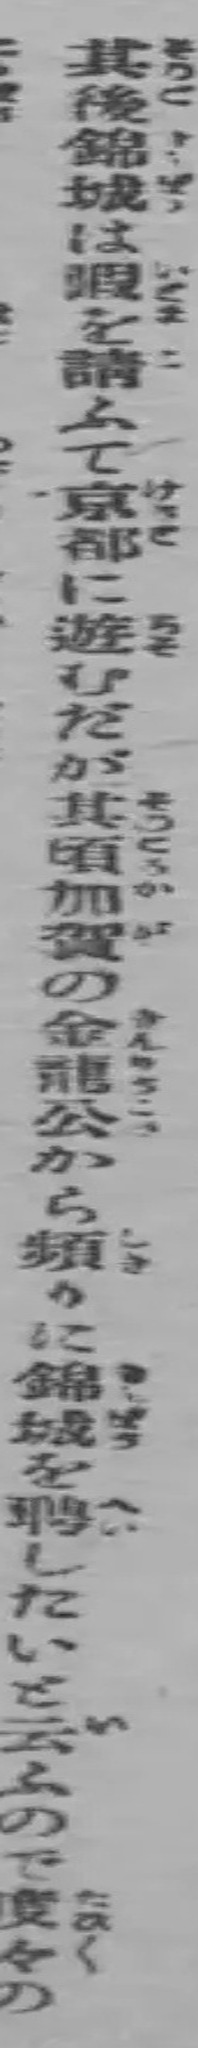其後錦城は暇を請ふて京都に遊むだが其頃加賀の金龍公から頻りに錦城を聘したいと云ふので度々の
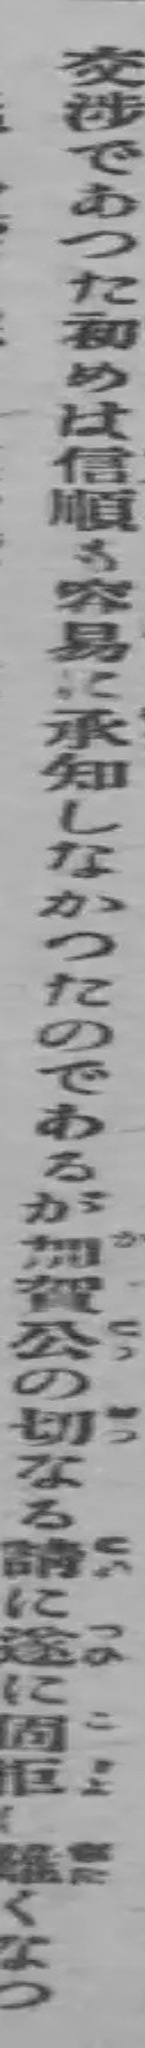交渉であつた初めは信順も容易に承知しなかつたのであるが加賀公の切なる請に遂に固拒し難くなつ
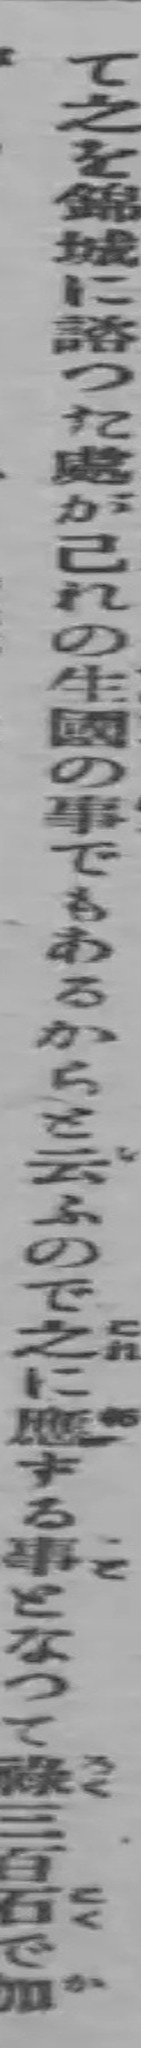て之を錦城に諮つた処己れの生国の事でもあるからと云ふので之に応ずる事となつて禄三百石で加
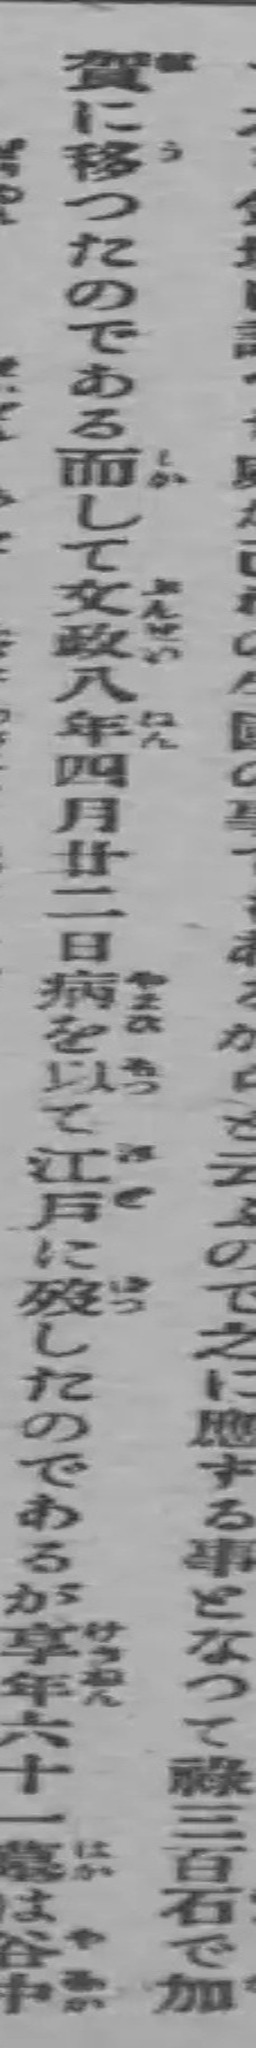賀に移つたのである而して文政八年四月廿二日病を以て江戸に没したのであるが享年六十一墓は谷中
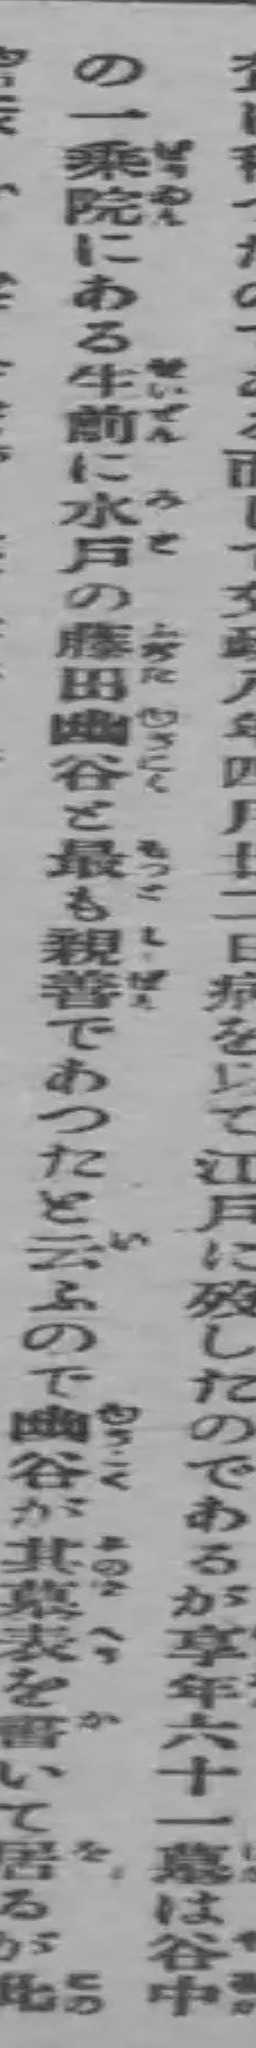の一乗院にある生前に水戸の藤田幽谷と最も親善であつたと云ふので幽谷が其墓表を書いて居るが此
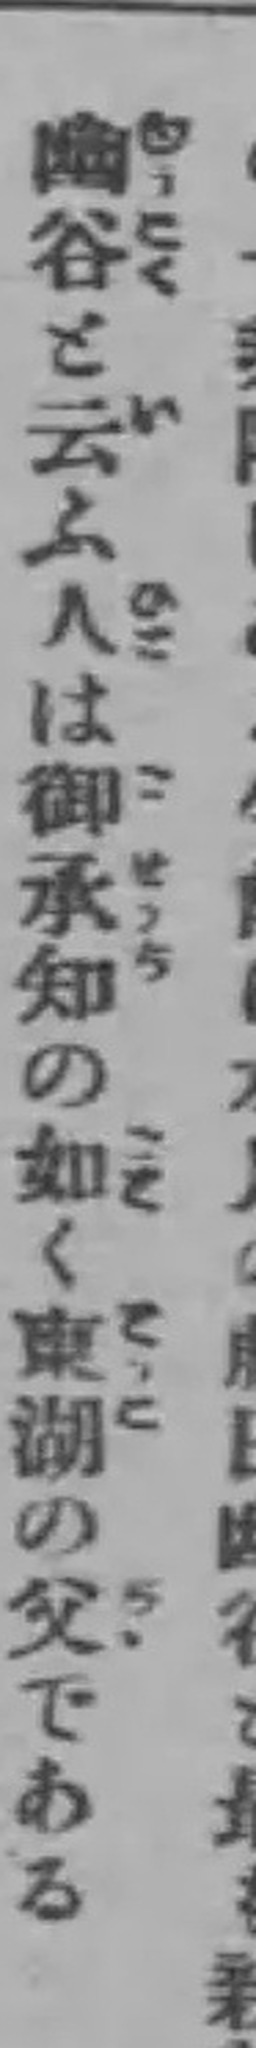幽谷と云ふ人は御承知の如く東湖の父である
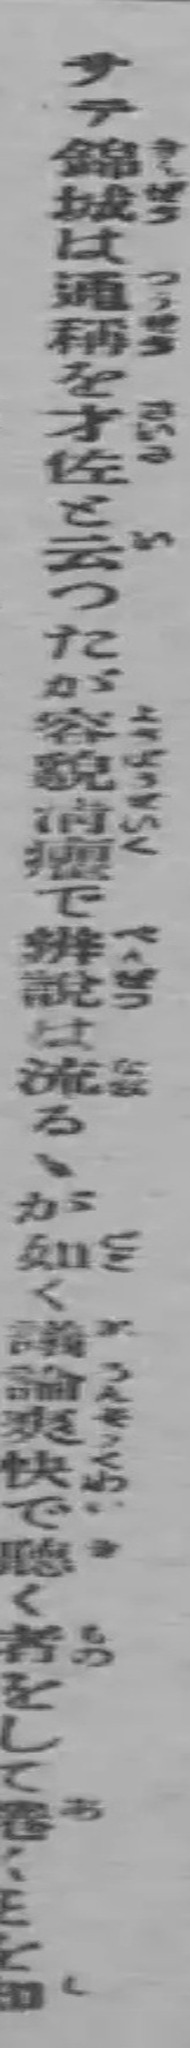サテ錦城は通称を才佐と云つたが容貌清癯で弁説は流るゝが如く議論爽快で聴く者をして倦くことを知
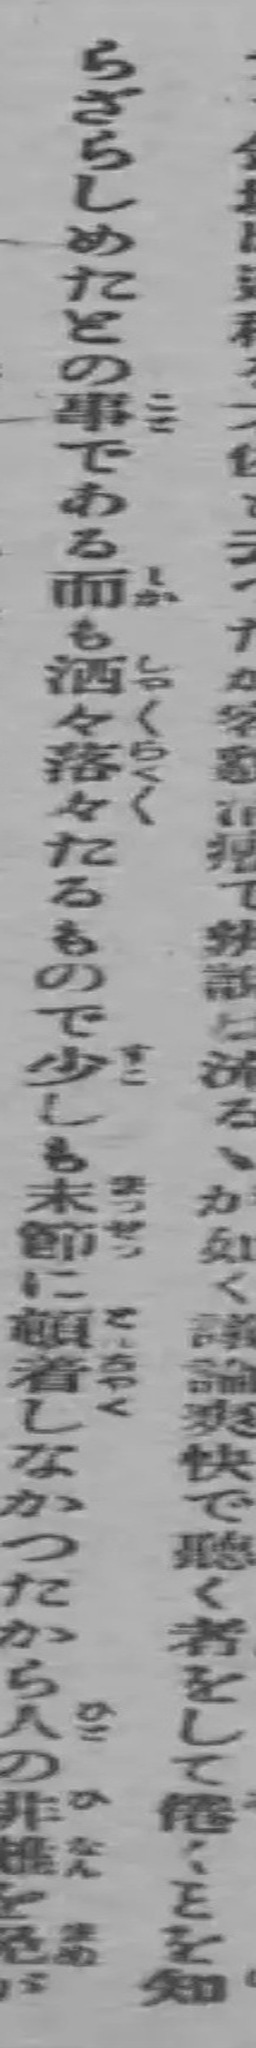らざらしめたとの事である而も洒々落々たるもので少しも末節に頓着しなかつたから人の非難を免が
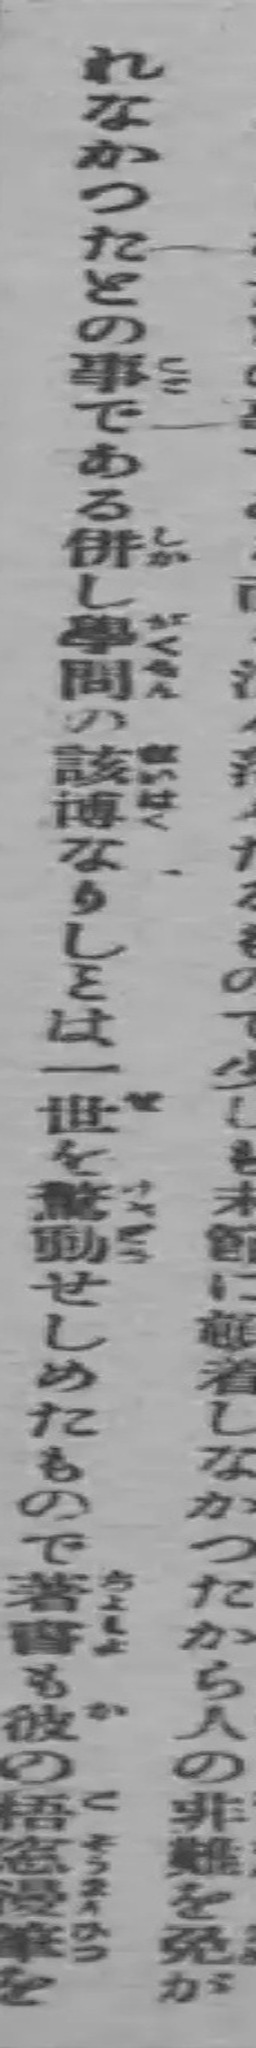れなかつたとの事である併し学問の該博なりしことは一世を驚動せしめたもので著書も彼の梧窓漫筆を
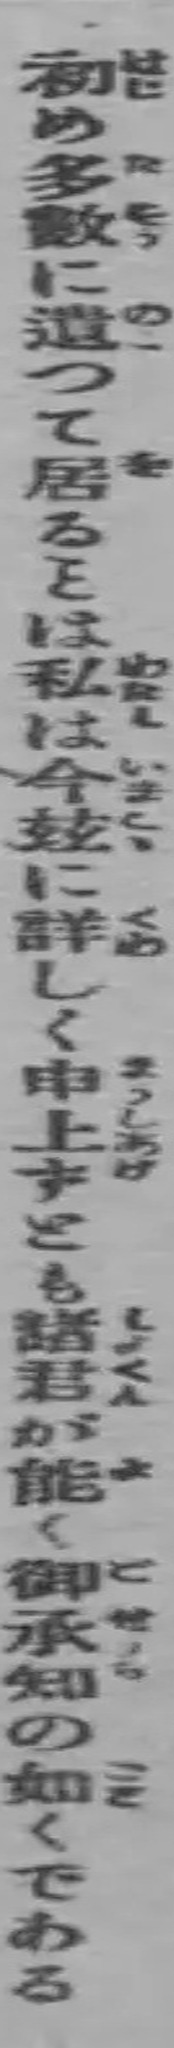初め多数に遺つて居ることは私は今茲に詳しく申上ずとも諸君が能く御承知の如くである
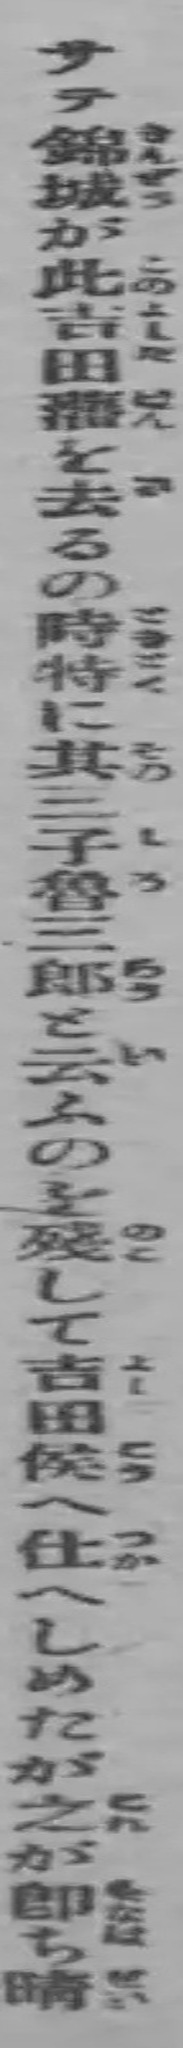太田晴軒サテ錦城が此吉田藩を去るの時特に其三子魯三郎と云ふのを残して吉田侯へ仕へしめたが之が即ち晴
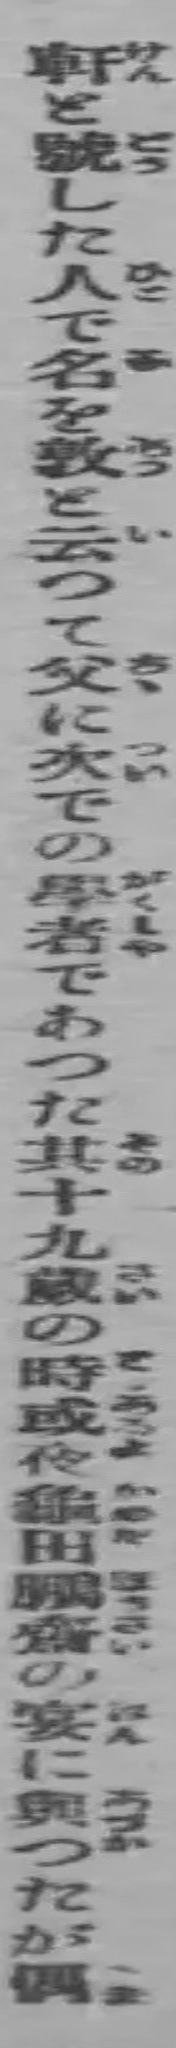軒と号した人で名を敦と云つて父に次での学者であつた其十九歳の時或夜亀田鵬齋の宴に与つたが偶
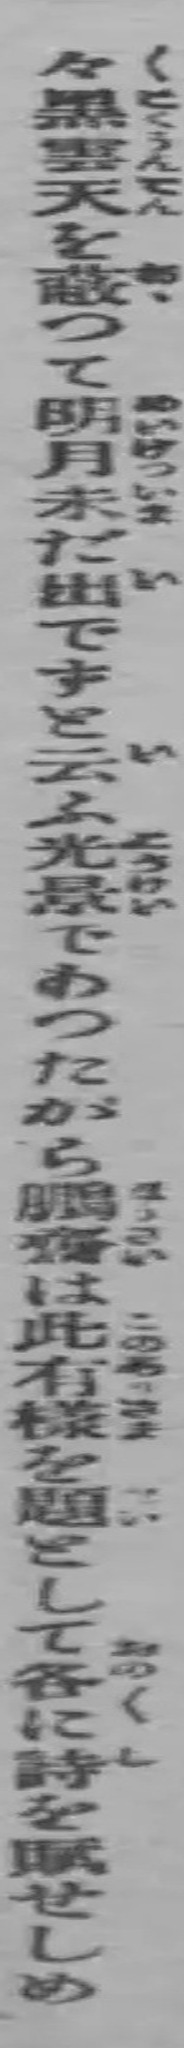偶黒雲天を蔽つて明月未だ出でずと云ふ光景であつたから鵬齋は此有様を題として各に詩を賦せしめ
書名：豊橋市史談
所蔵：国立国会図書館 National Diet Library, JAPAN
